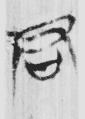君
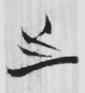之
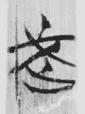武
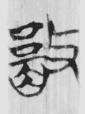{育攴}
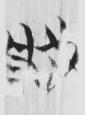戕
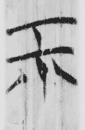{示工}
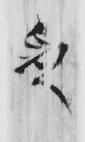色
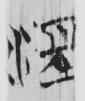涇
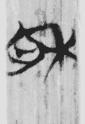{肉木}
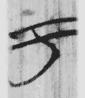于
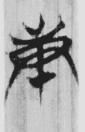庚
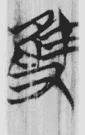雘
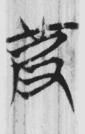皮
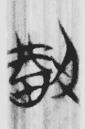{刱田}
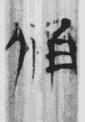俑
